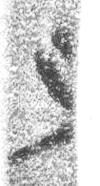之
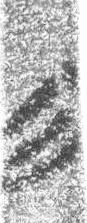易（狄）
